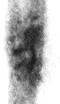辛
